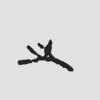出
